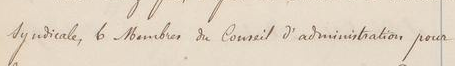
Syndicale, 6 Membres du Conseil d'administration pour
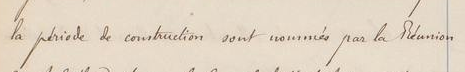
la période de construction sont nommés par la Réunion
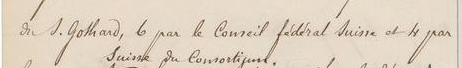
du S. Gothard, 6 par le Conseil fédéral Suisse et 4 par
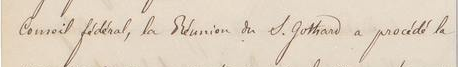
Conseil fédéral, la Réunion du S. Gothard a procédé la
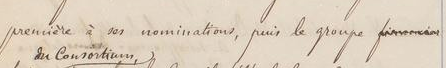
première à ses nominations, puis le groupe financier
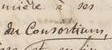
du Consortium
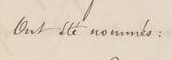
Ont été nommés:
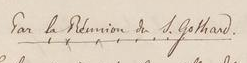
Par la Réunion du S. Gothard.
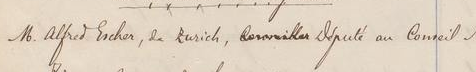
M. Alfred Escher, de Zurich, Conseiller Député au Conseil
